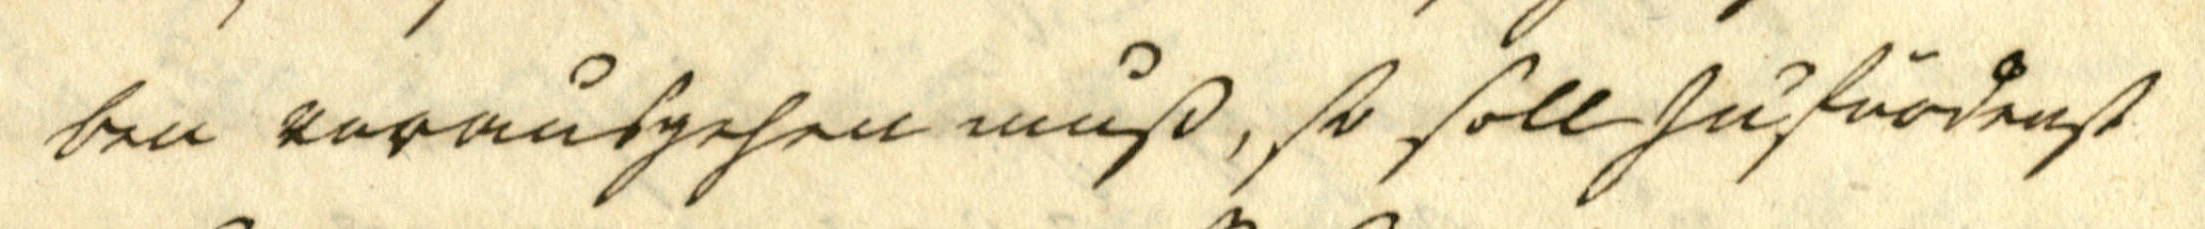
ben vorausgehen muß, so soll zuförderst
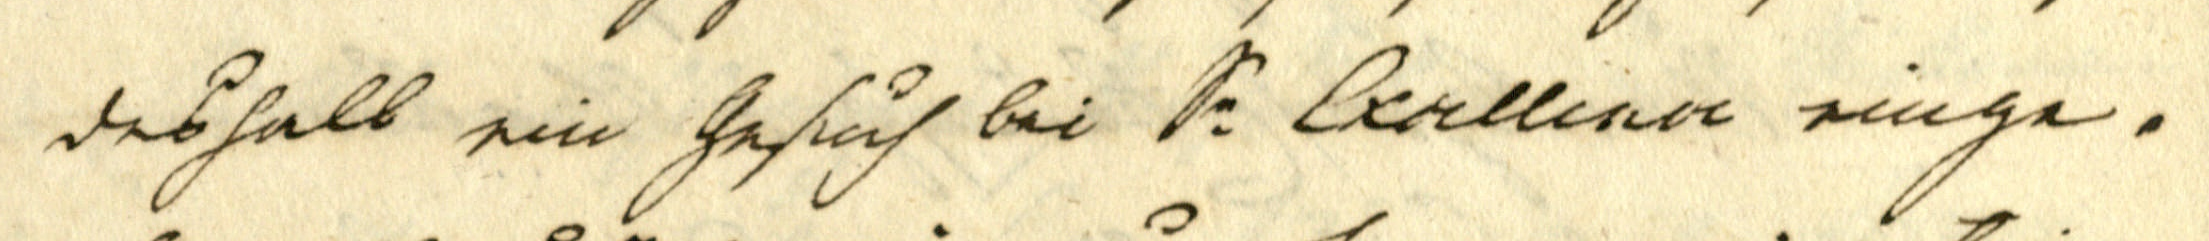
deshalb ein Gesuch bei Sr Excellence einge¬
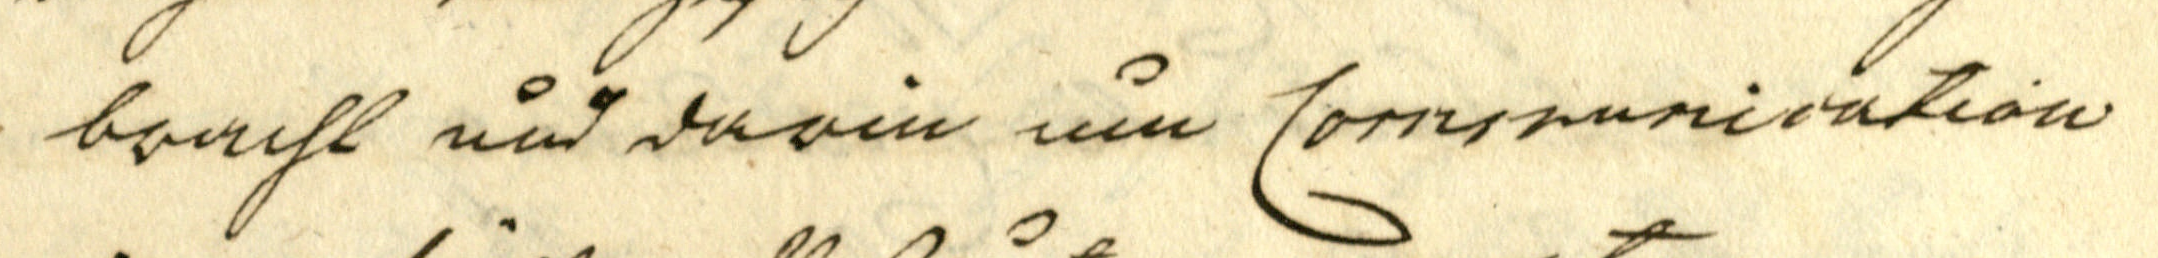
bracht und darim um Communication
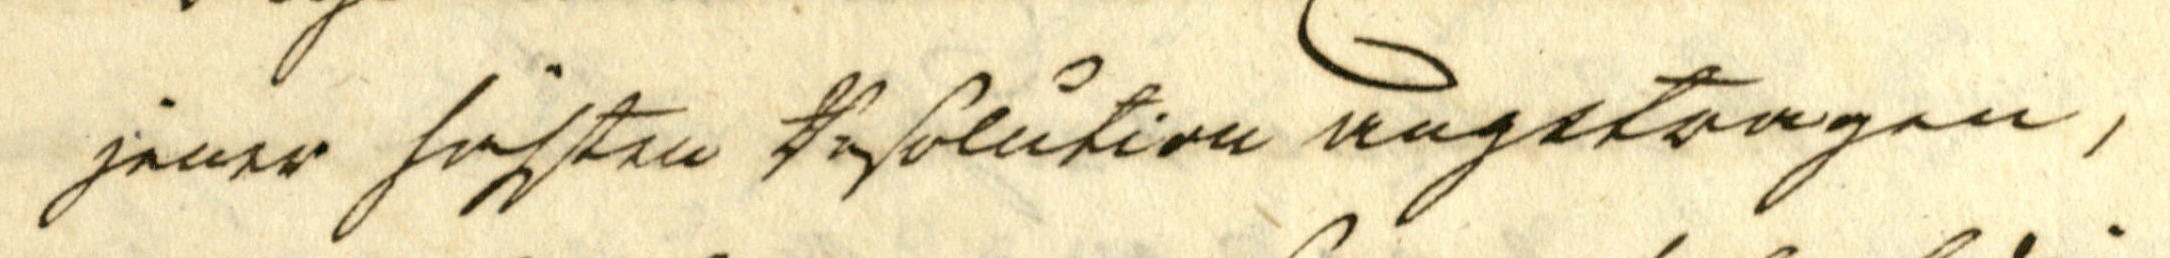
jener höchsten Resolution angetragen,
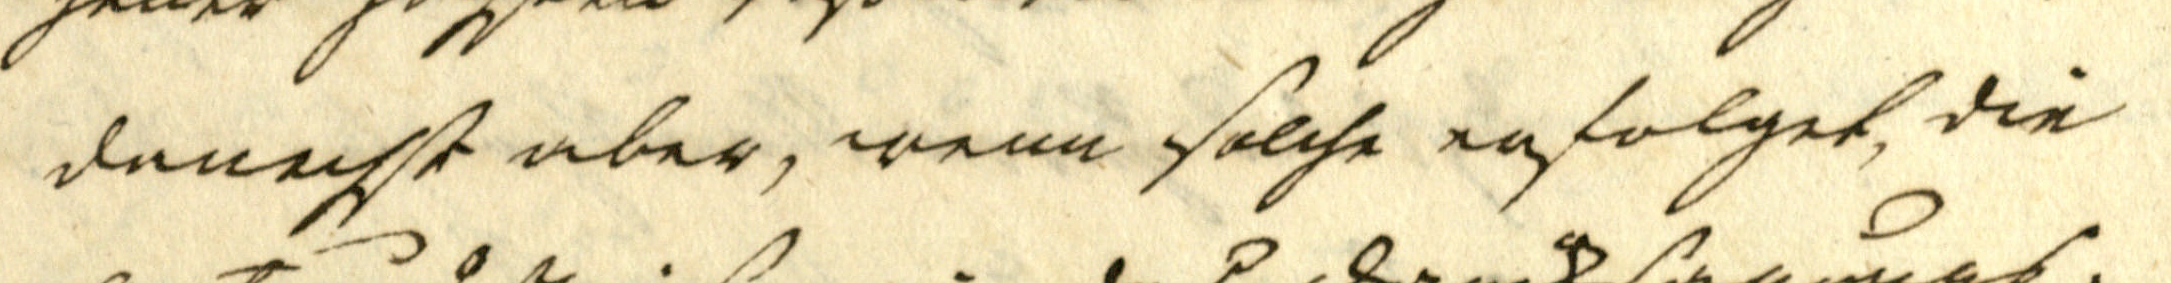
danechst aber, wenn solche erfolget, die
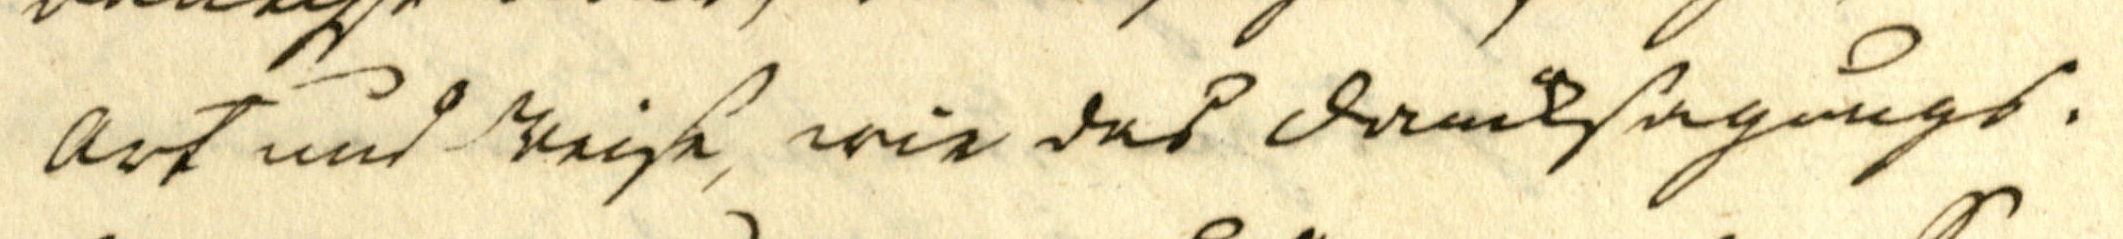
Art und Weise wie das Dancksagungs¬
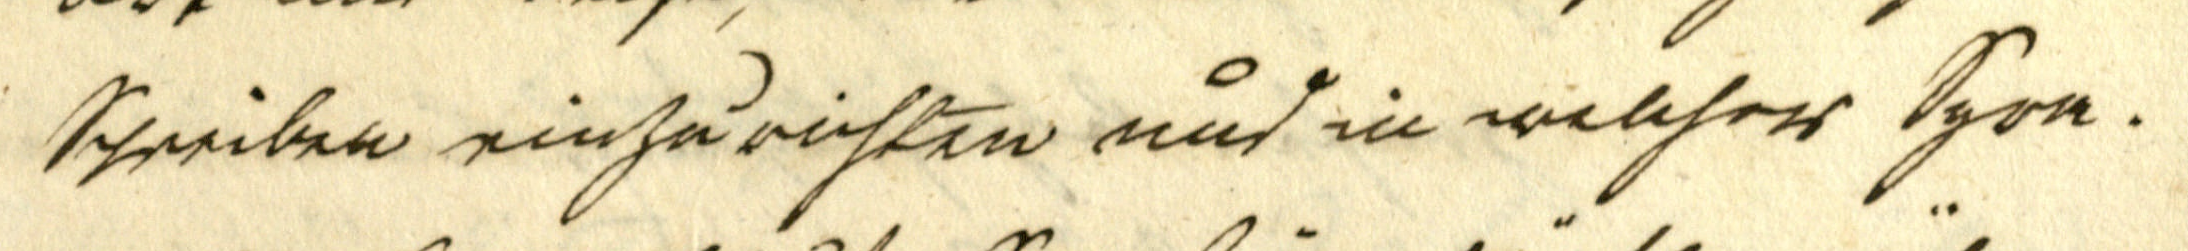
Schreiben einzurichten und in welcher Spra¬
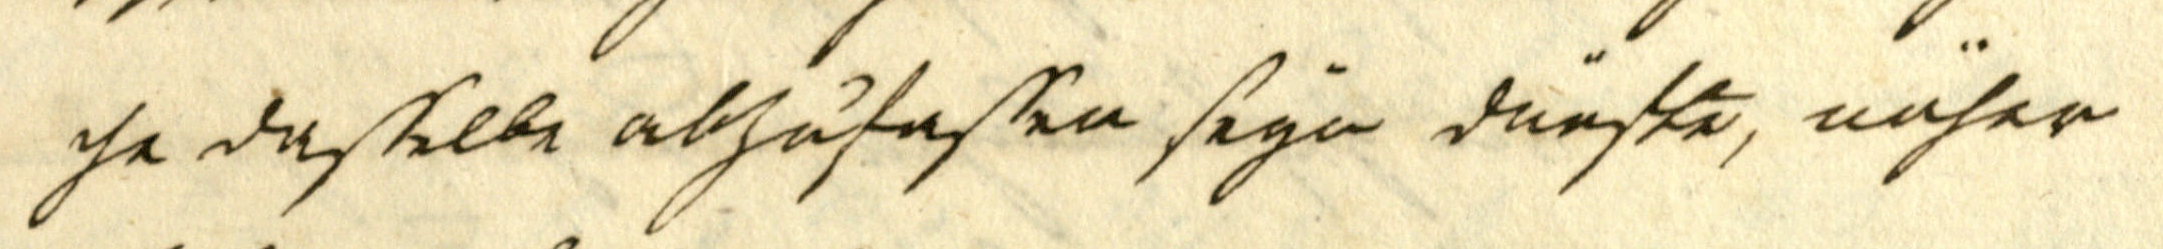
che dasselbe abzufassen seÿn dürfte, näher
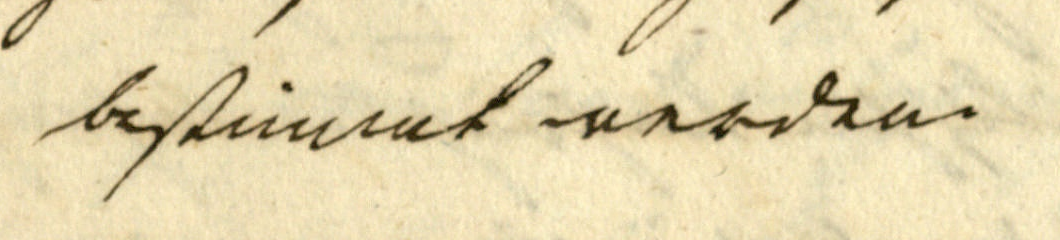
bestimmt werden.
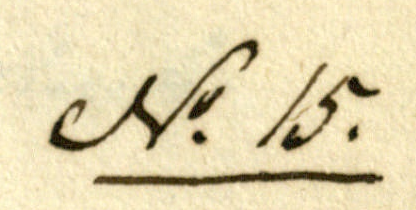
No 15.
